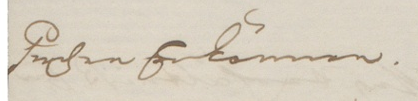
suchen zu können.
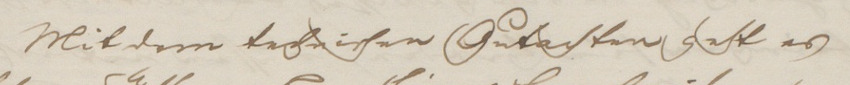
Mit dem technischen Gutachten geht es
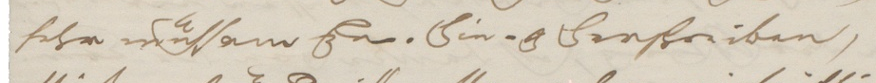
sehr mühsam zu. Hin & herschreiben,
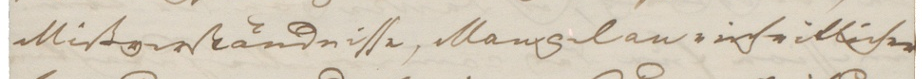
Mißverständnisse, Mangel an einheitlicher
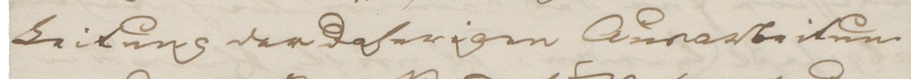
Leitung der daherigen Ausarbeitun-
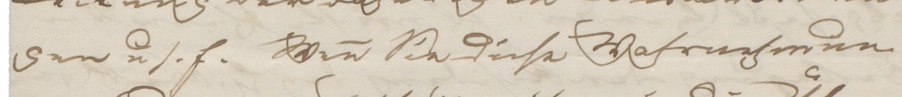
gen us. f. Wenn Sie diese Wahrnehmun-
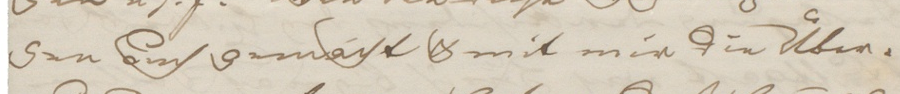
gen auch gemacht & mit mir die Über-
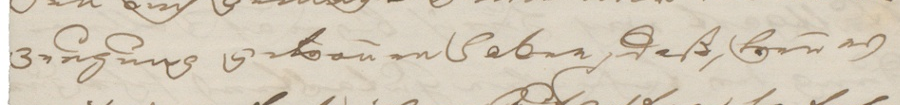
zeugung gewonnen haben, daß, wenn es
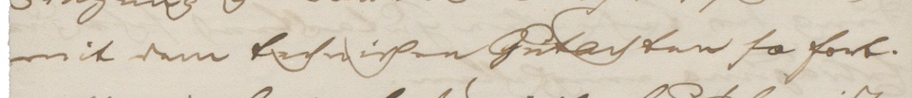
mit dem technischen Gutachten so fort-
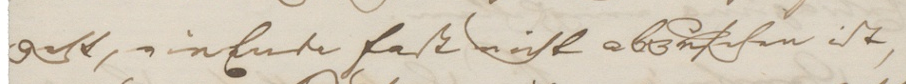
geht, ein Ende fast nicht abzusehen ist,
